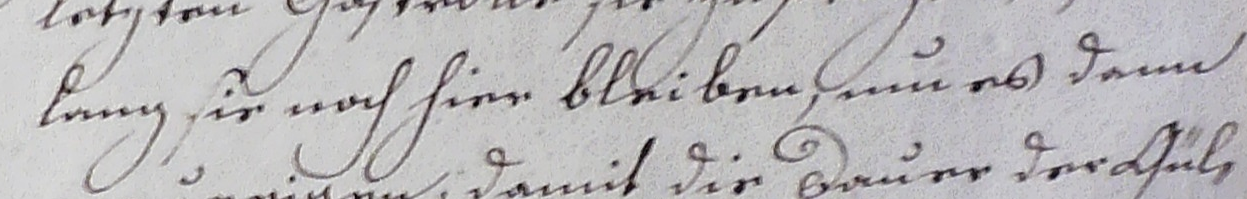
lang sie noch hier bleiben, um es dann
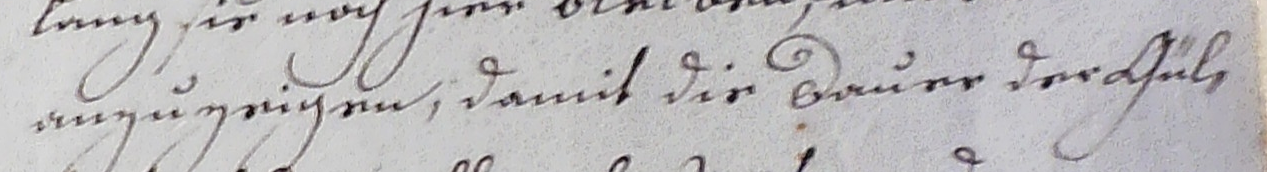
anzuzeigen, damit die Dauer der Gül¬
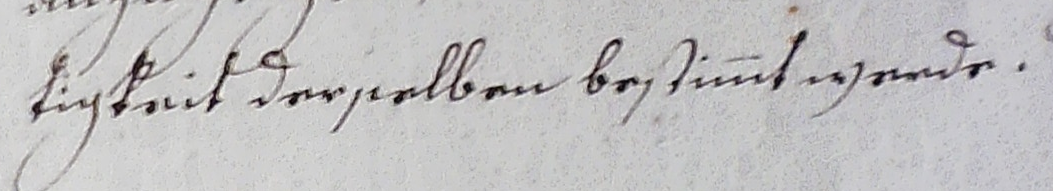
tigkeit derselben bestim̅t werde.
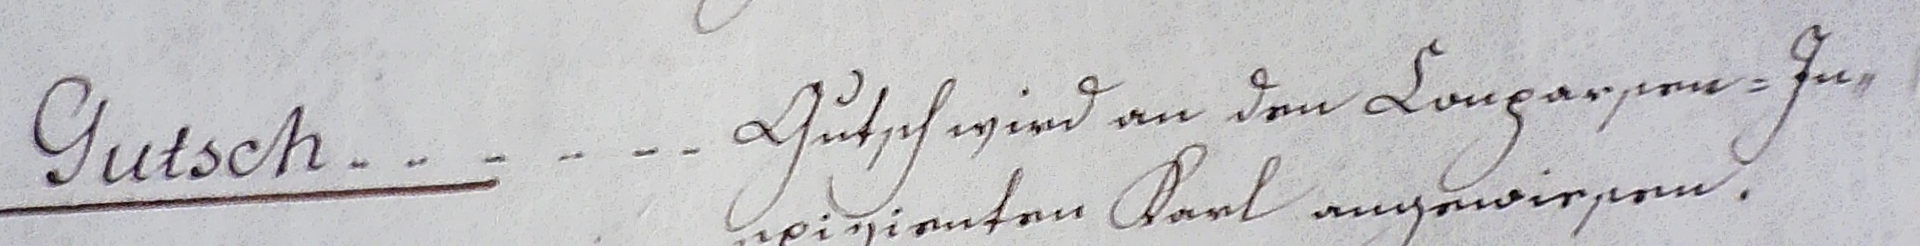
Gutsch .. .. .. .. .. . Gutsch wird an den Conparsen=In¬
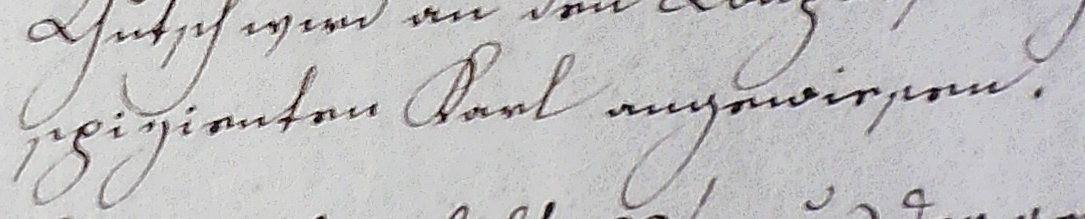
spizienten Karl angewiesen.
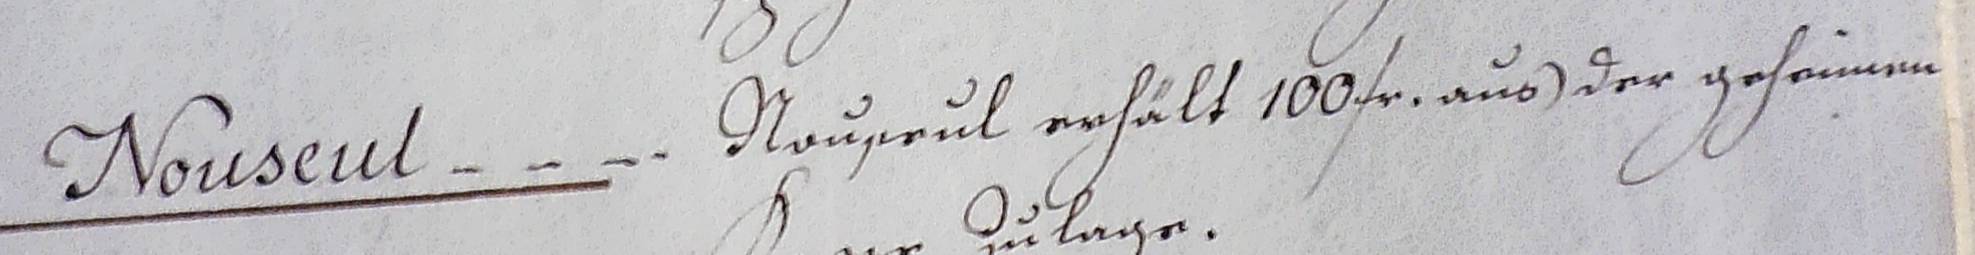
Nouseul .. .. .. . Nouseul erhält 100fr. aus der geheimen
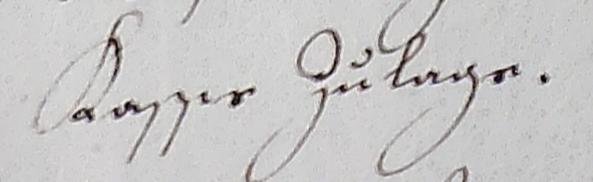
Kasse Zulage.
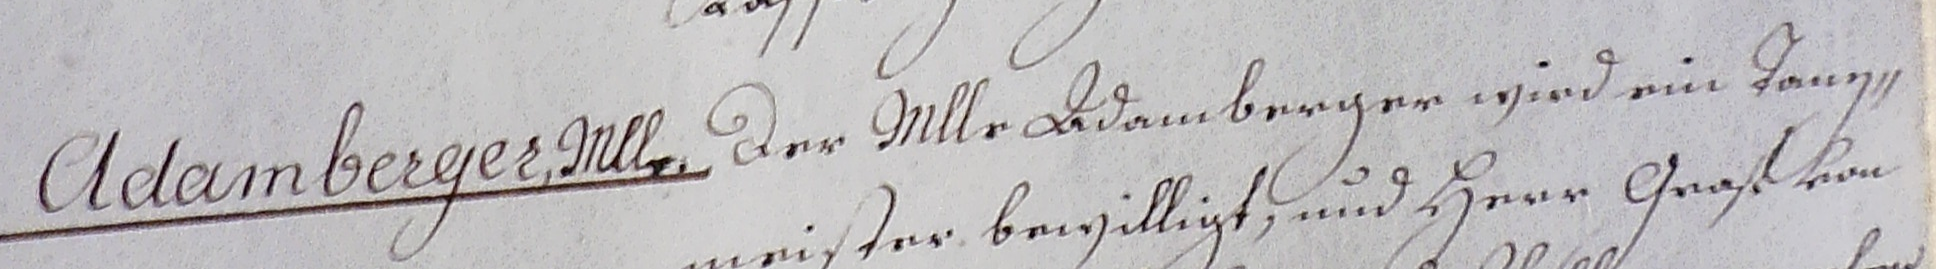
Adamberger, Mlle. Der Mlle Adamberger wird ein Tanz¬
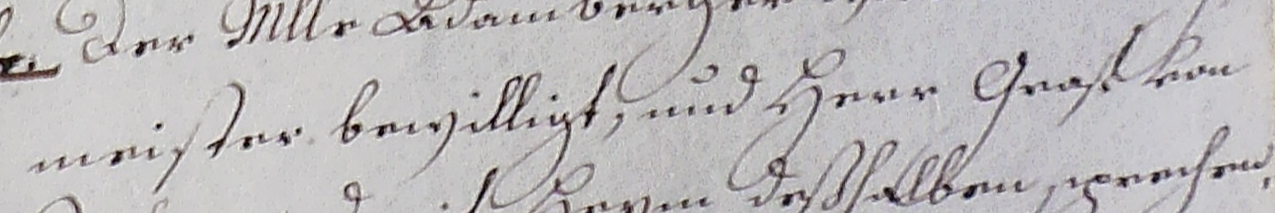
meister bewilligt und Herr Graf von
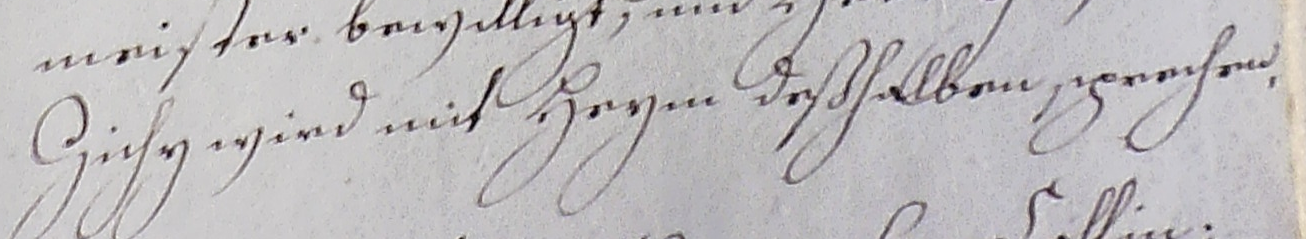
Zichy wird mit Heym deßhalben sprechen.
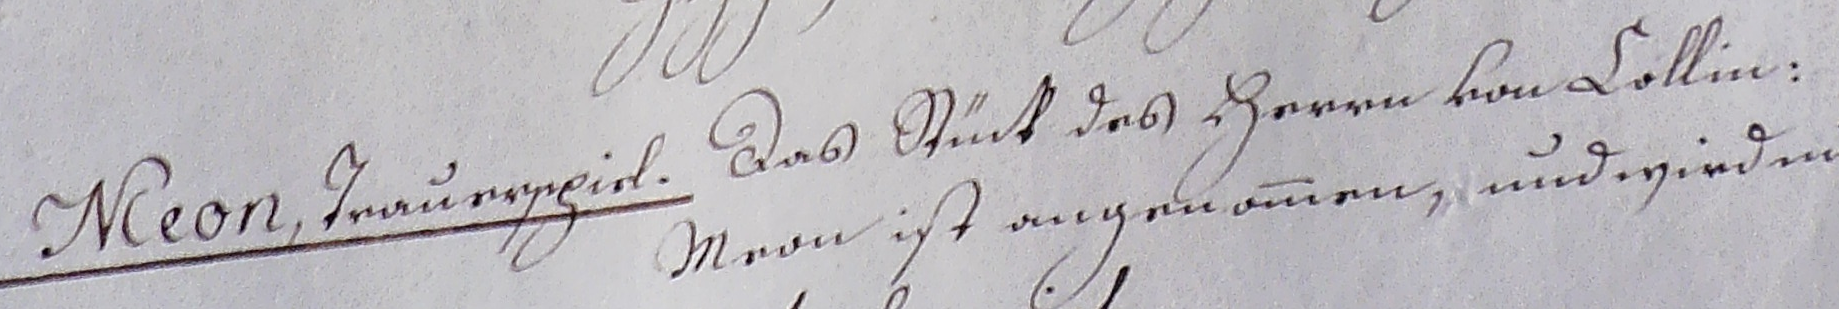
Meon, Trauerspiel. Das Stück des Herrn von Collin:
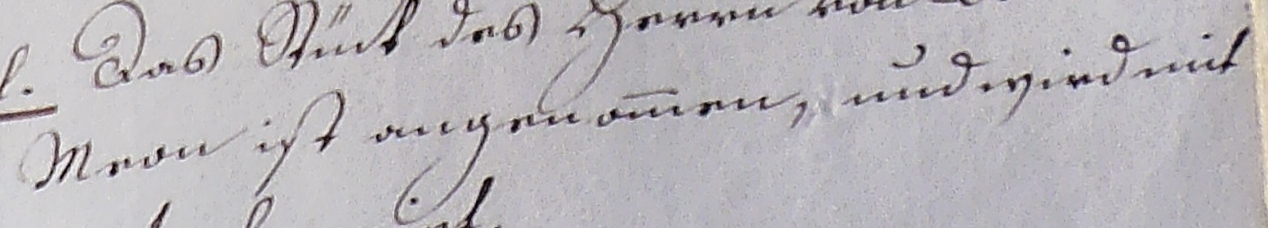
Meon ist angenom̅en, und wird mit
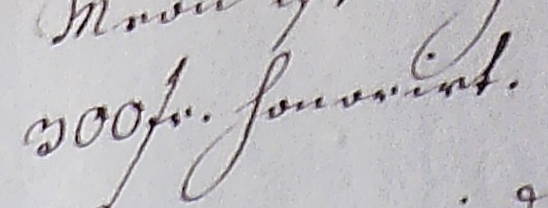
300fr. honorirt.
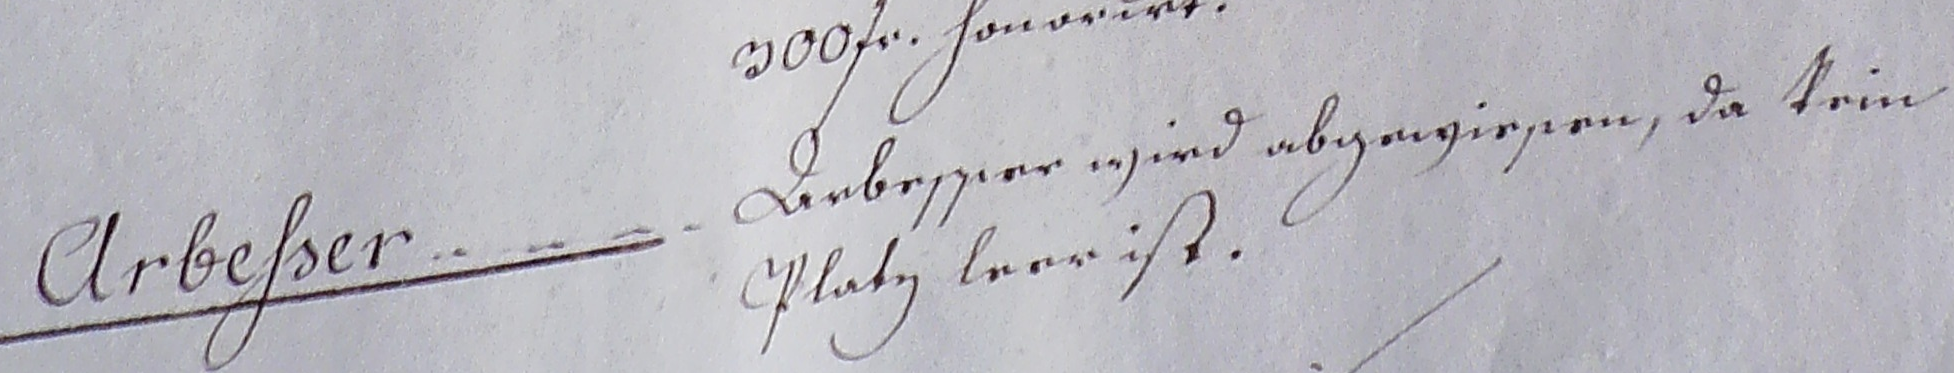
Arbesser .. .. .. Arbesser wird abgewiesen, da kein
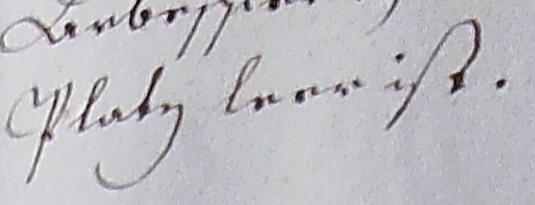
Platz leer ist.
